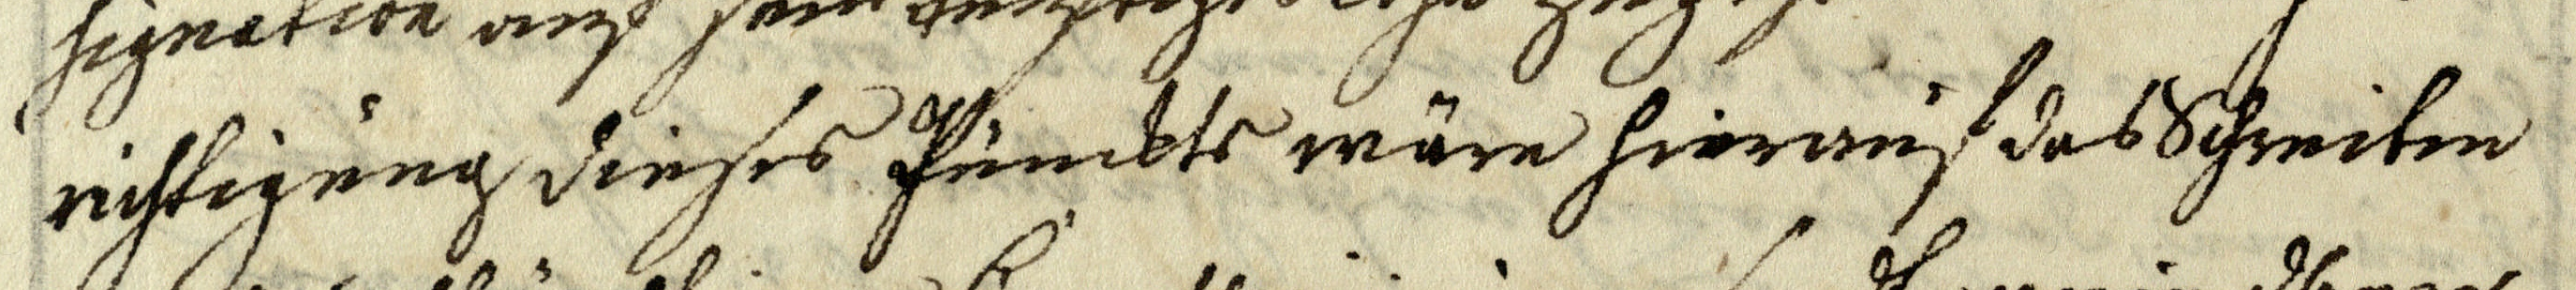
richtigung dieses Punckts wäre hierauf das Schreiben
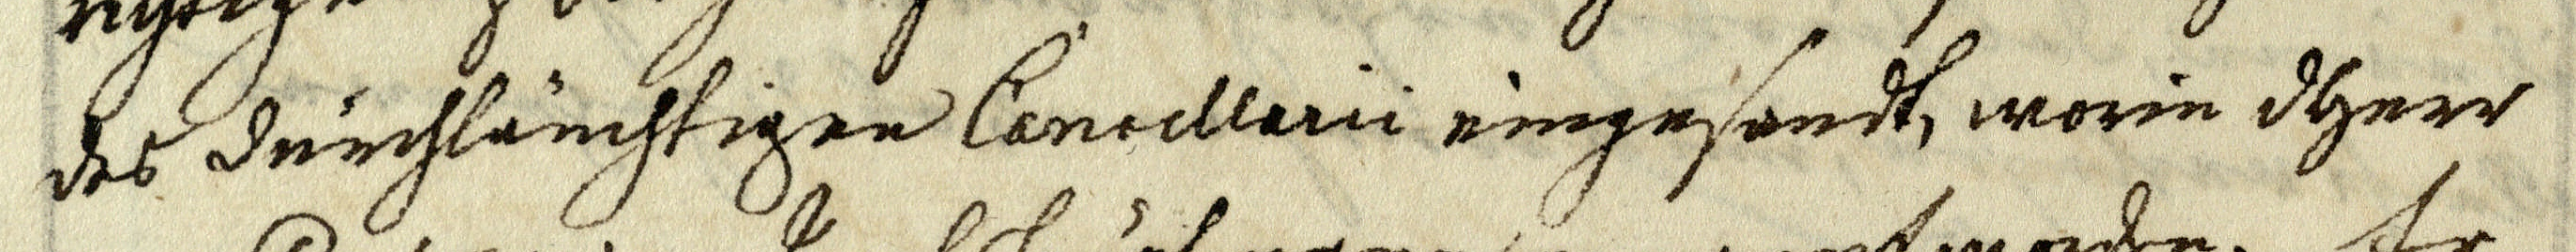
des Durchlauchtigen Cancellarii eingesandt, worin d Herr
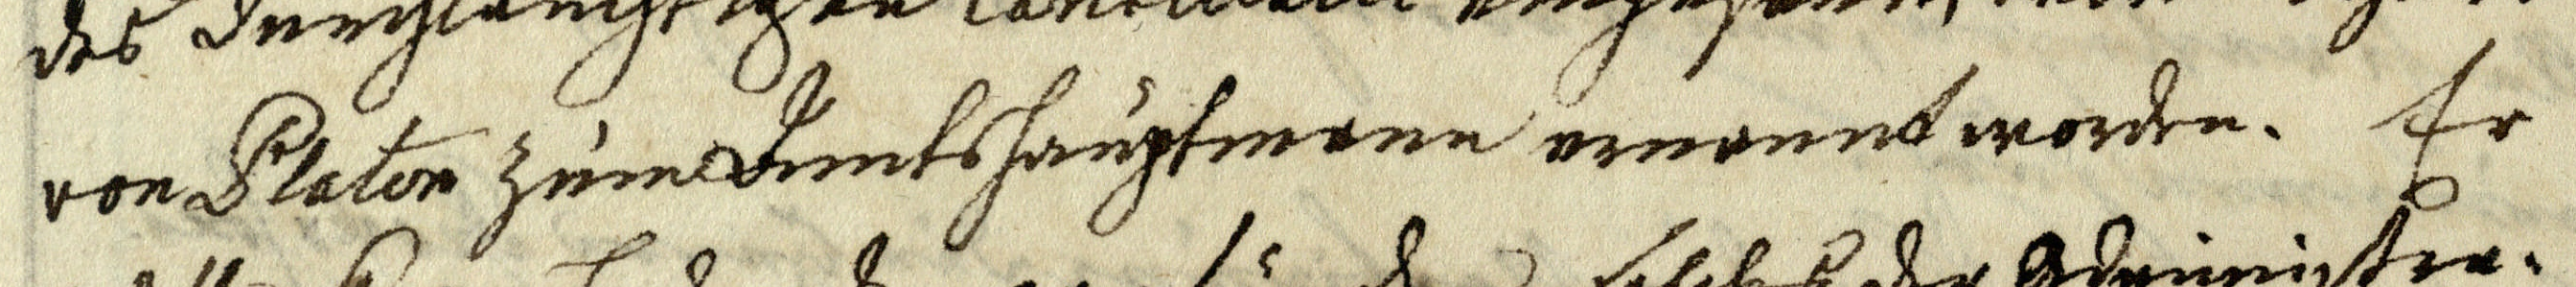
von Platen zum Amtshauptmann ernannt worden. Er
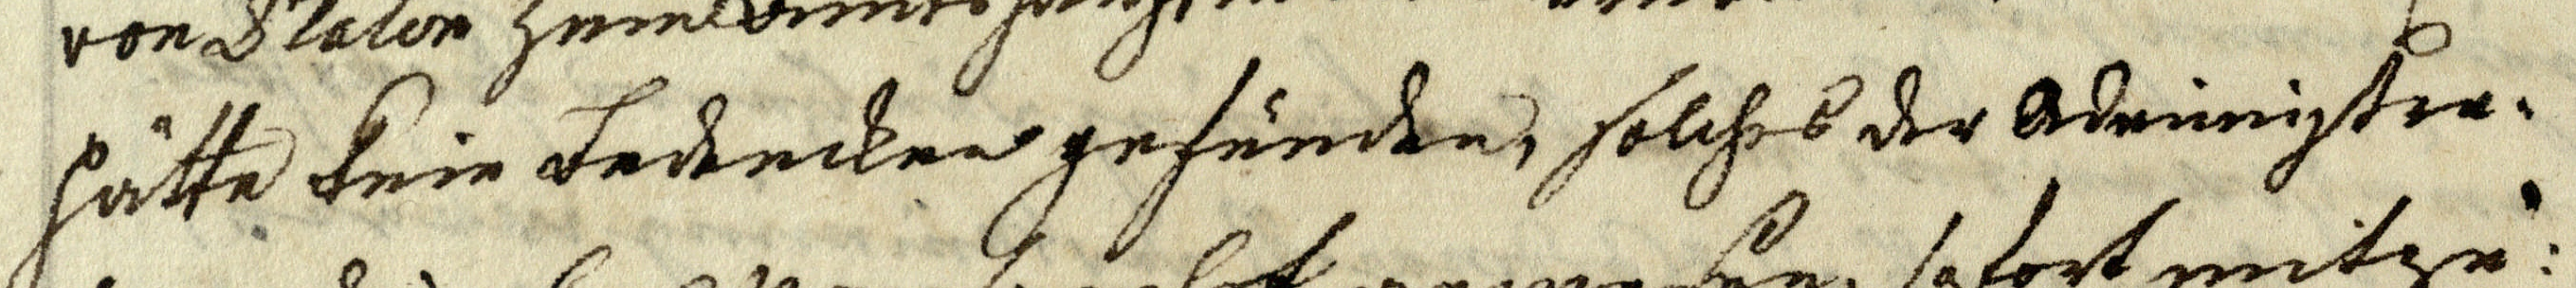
hätte kein Bedencken gefunden, solches der Administra¬
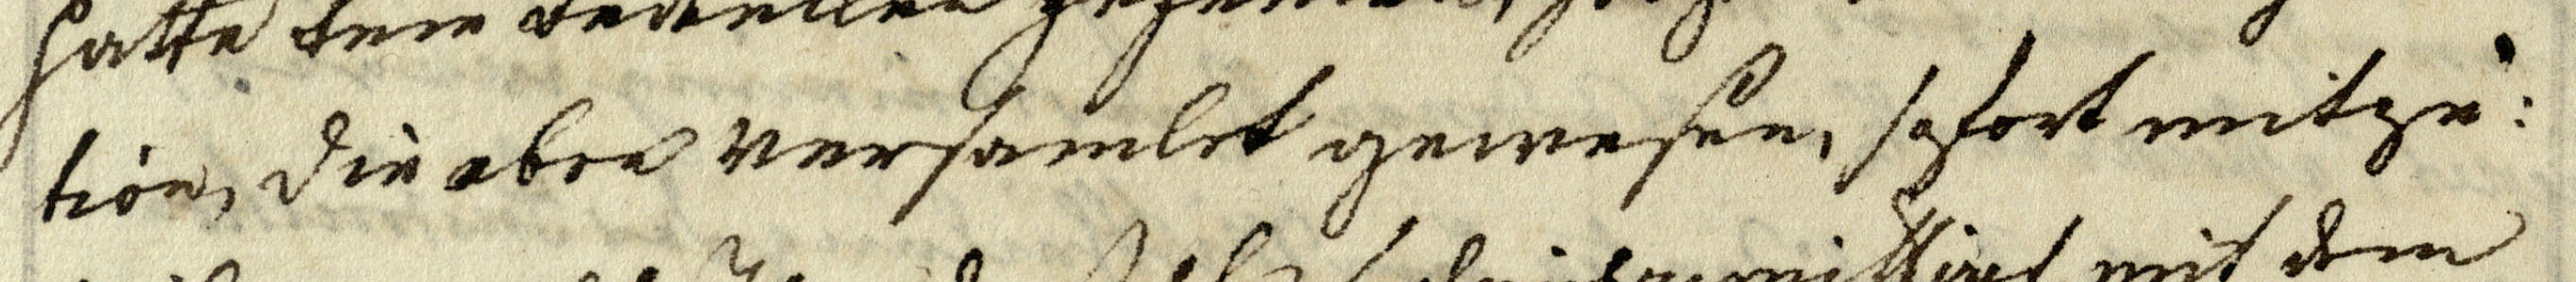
tion, die oben versamlet gewesen, sofort mitzu¬
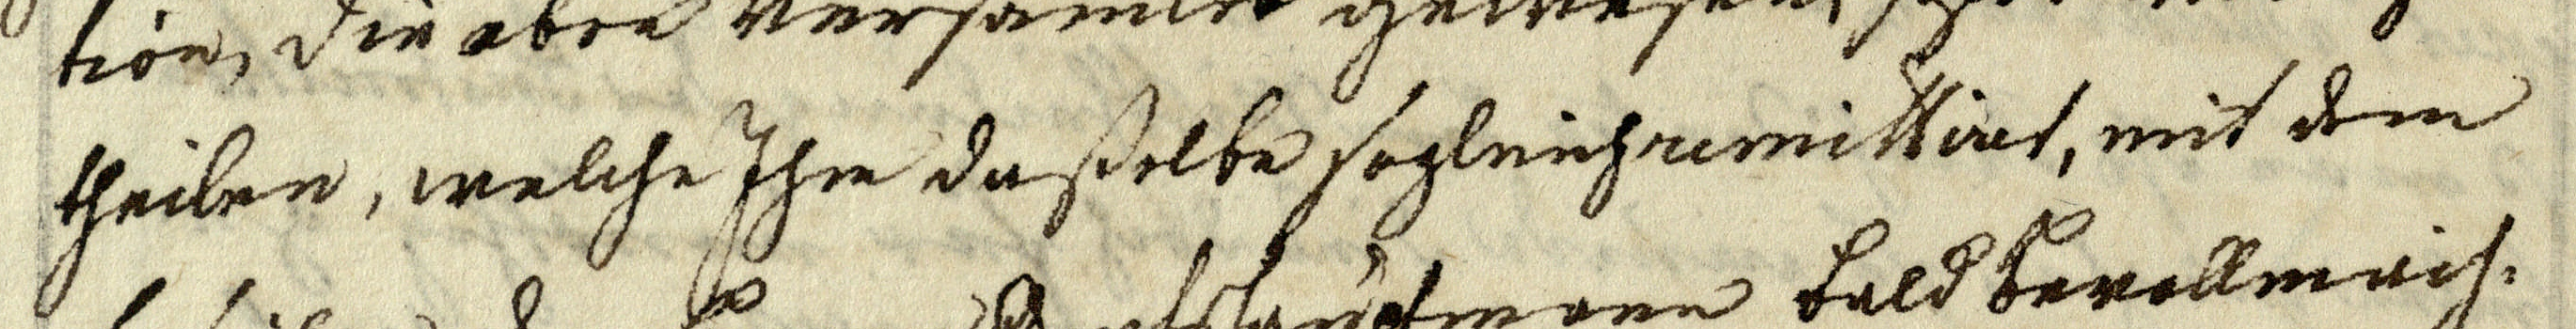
theilen, welche ihm daßelbe sogleich remittiret, mit dem
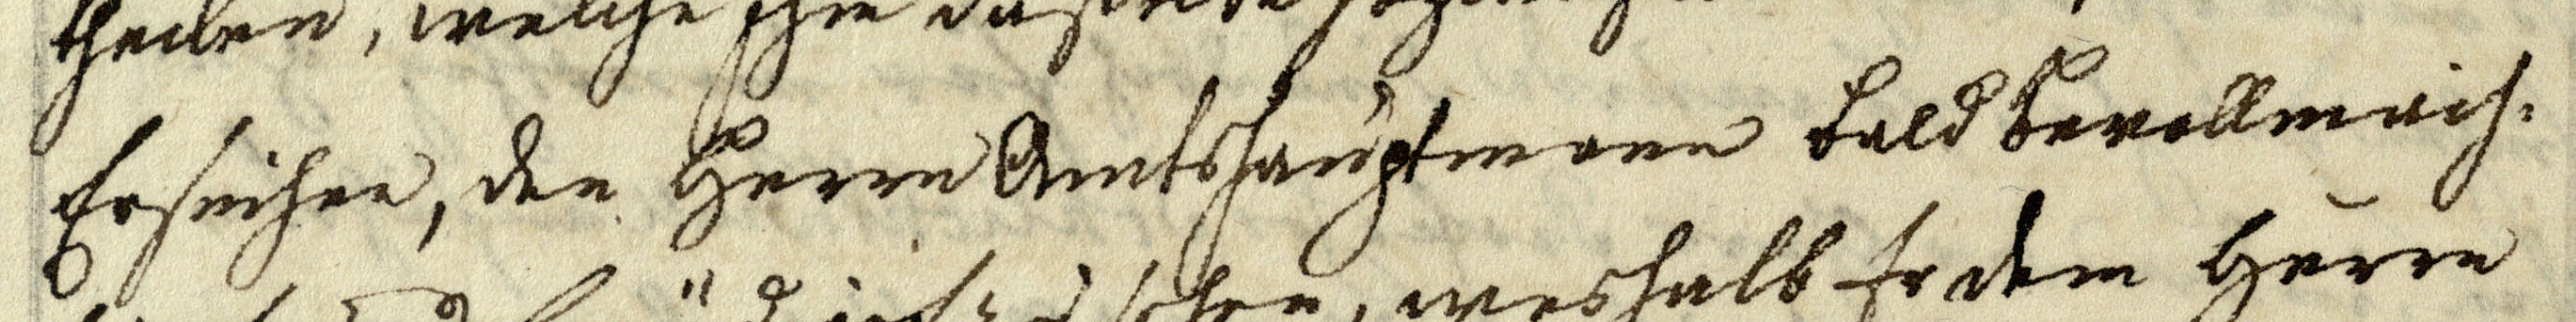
Ersuchen, den Herrn Amtshauptmann bald bevollmäch¬
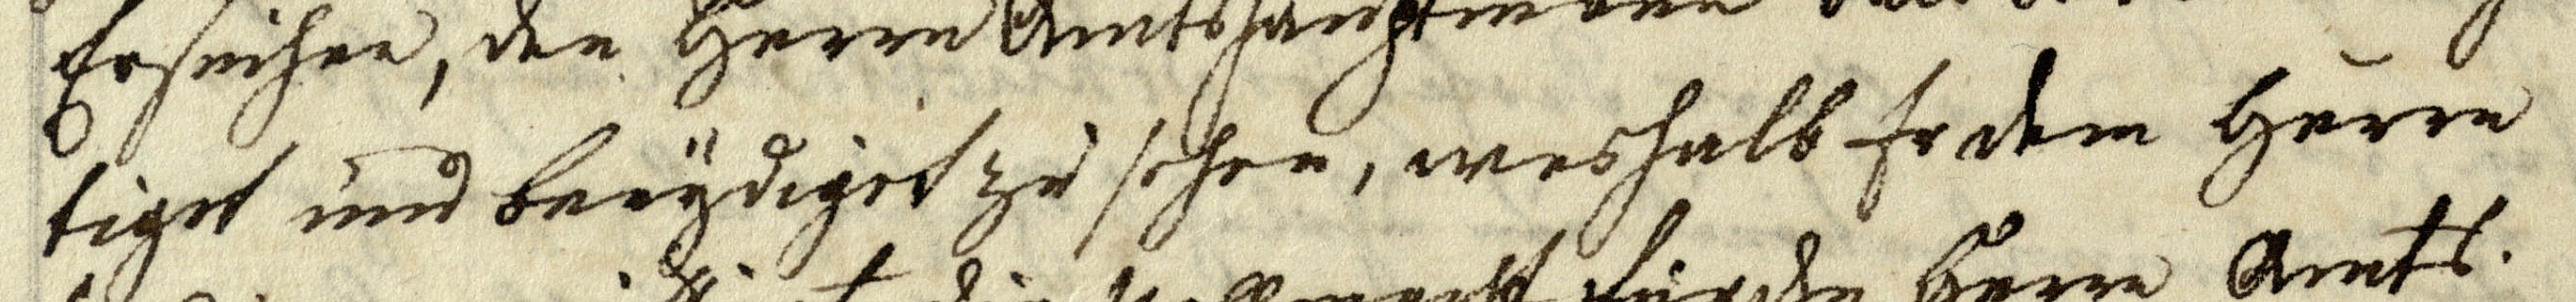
tiget und beeÿdiget er sehen, weshalb Er dem Herrn
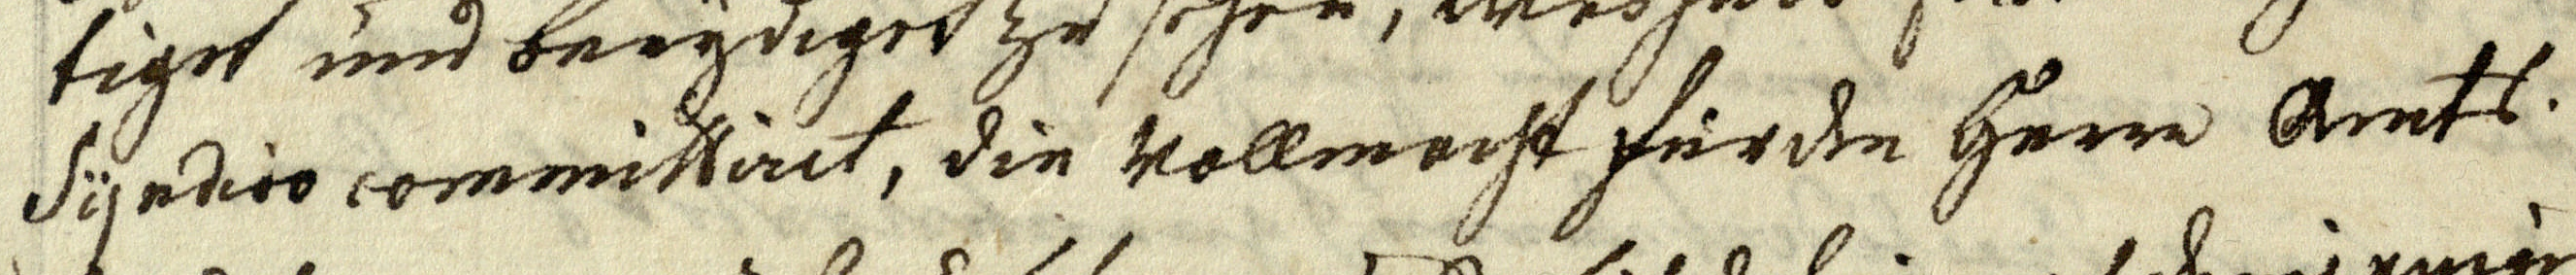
Sÿndico committiret, die Vollmacht für den Herrn Amts
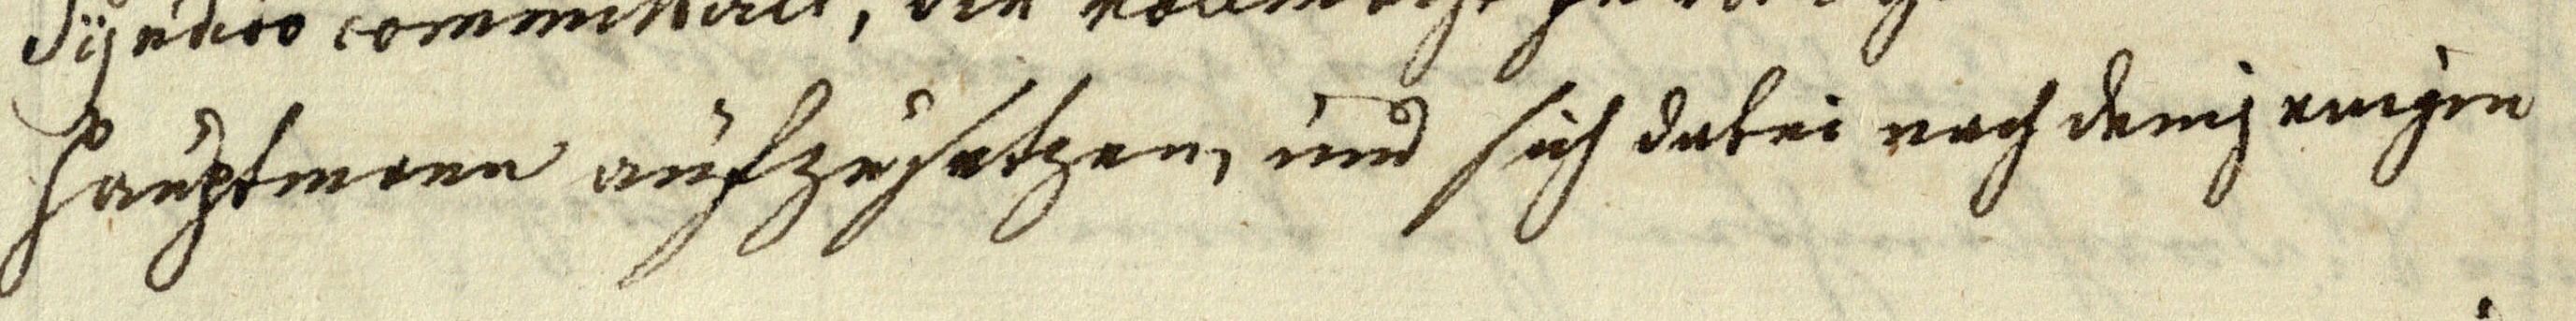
Hauptmann aufzusetzen, und sich dabei nach demjenigen
